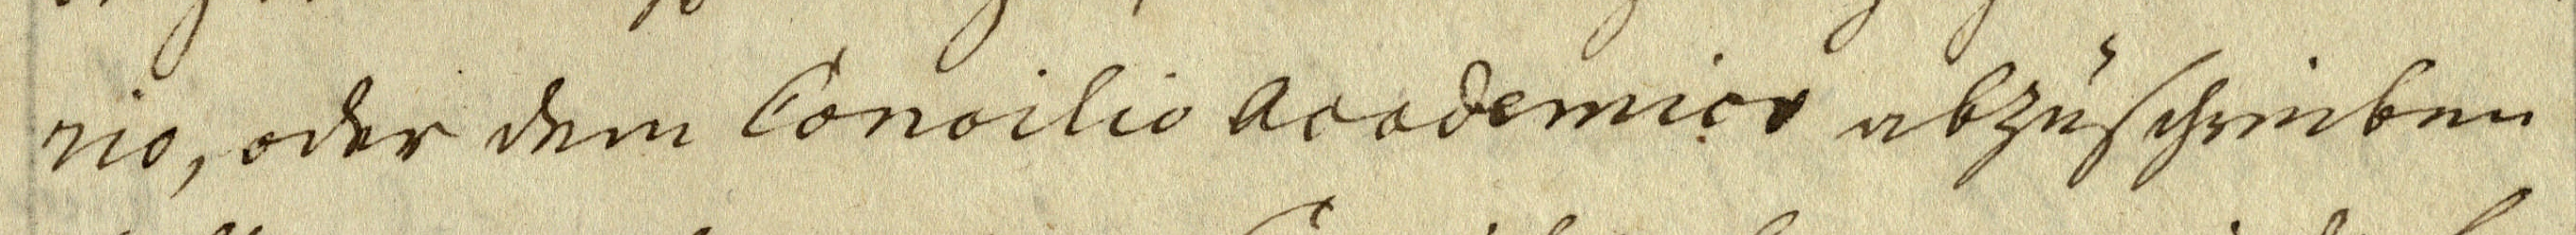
rio, oder dem Concilio Academico abzuschreiben
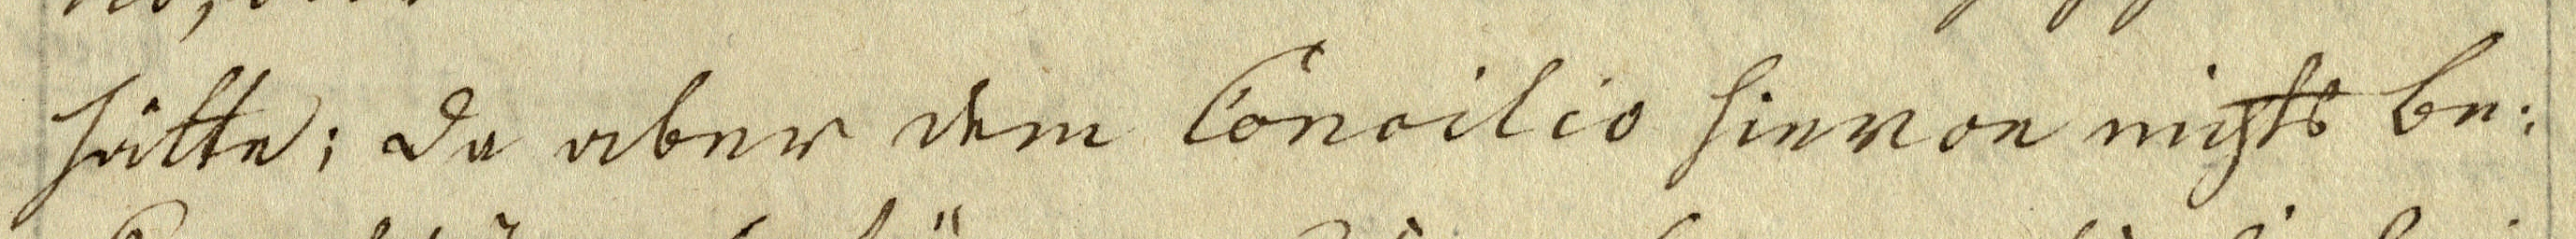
hätte, da aber dem Concilio hievon nichts be¬
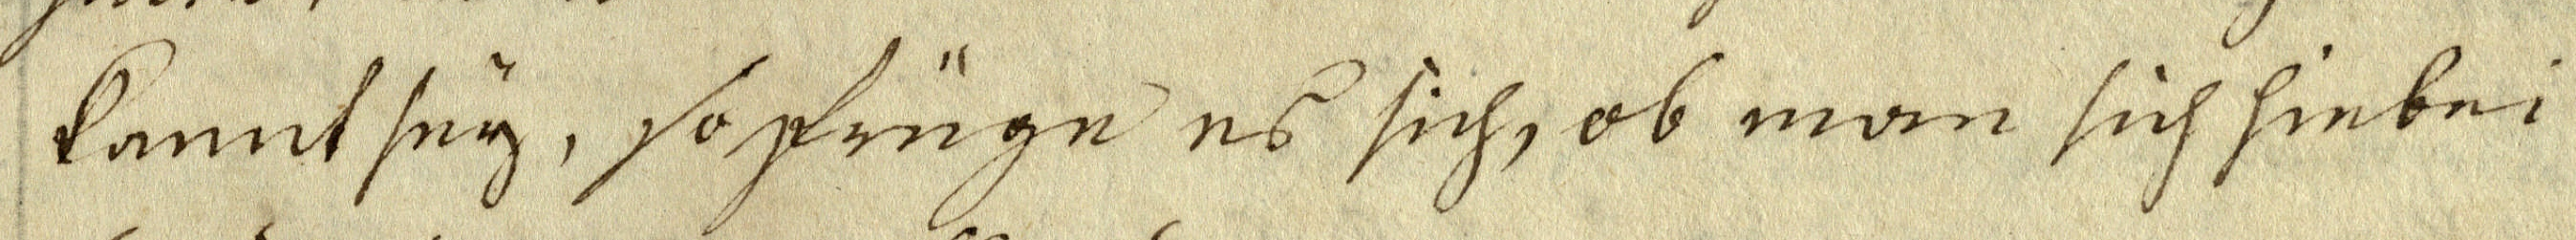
kannt seÿ, so früge es sich ob man sich hiebei
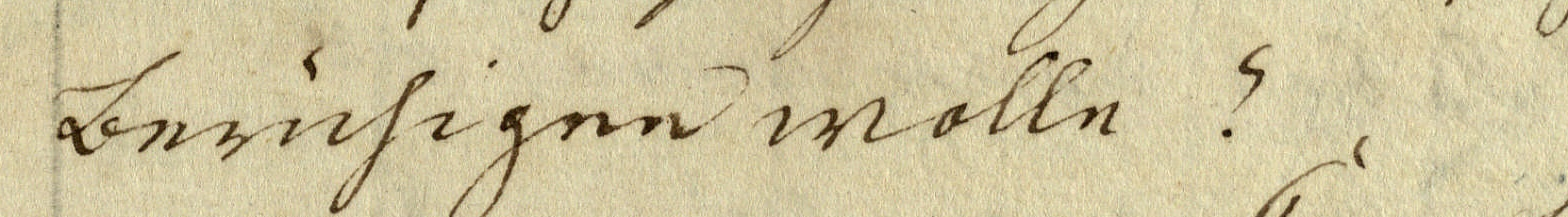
beruhigen wolle ?
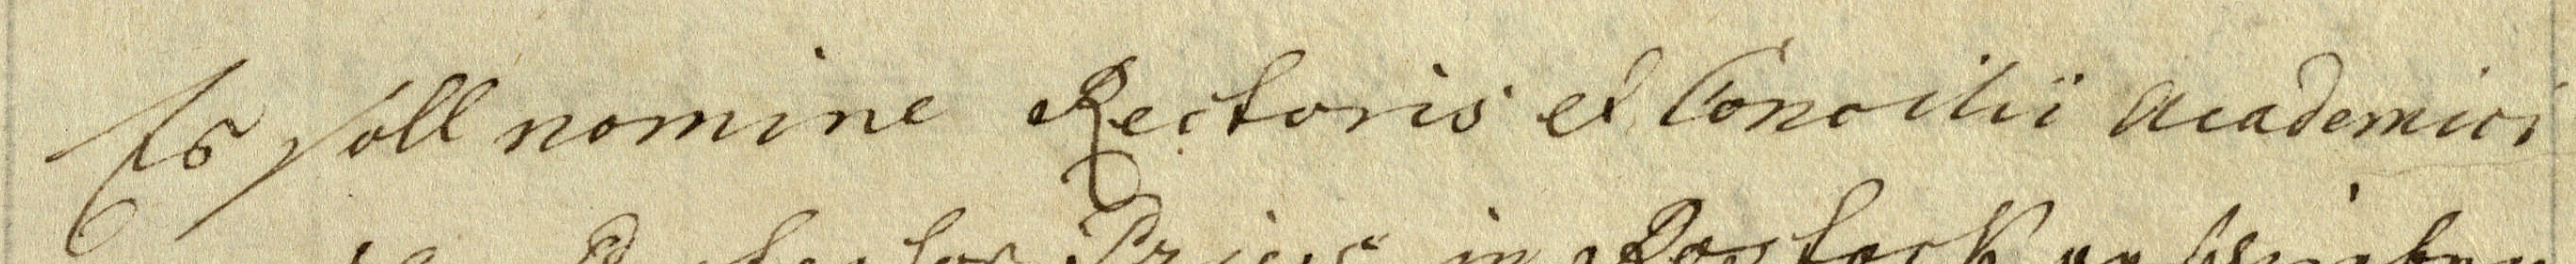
Es soll nomine Rectoris et Concilii Academici
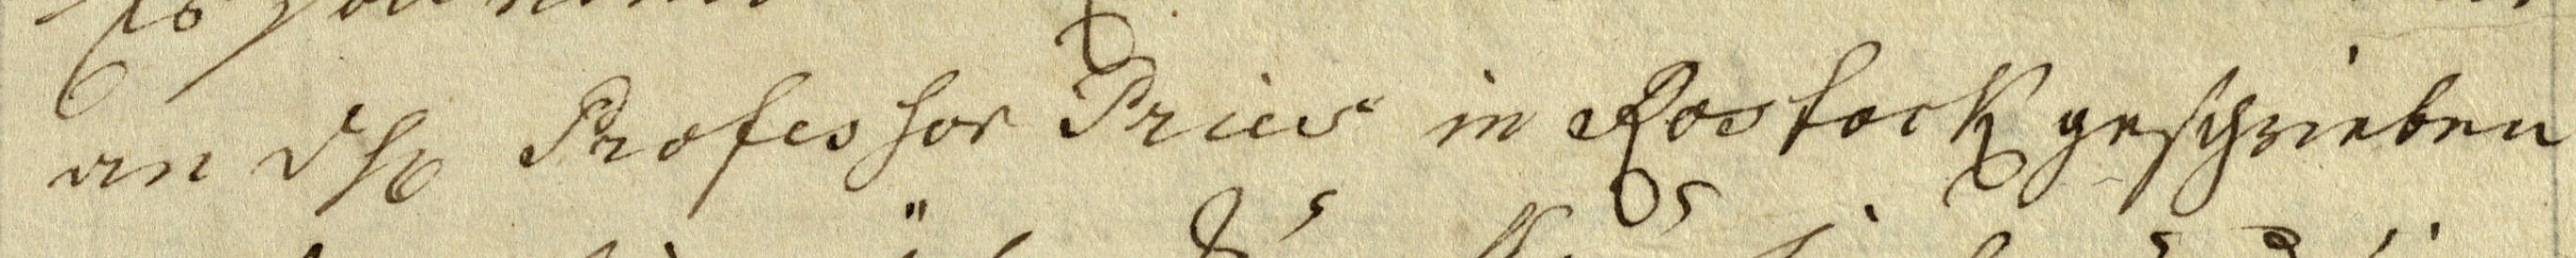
an dh Professor Pries in Rostock geschrieben
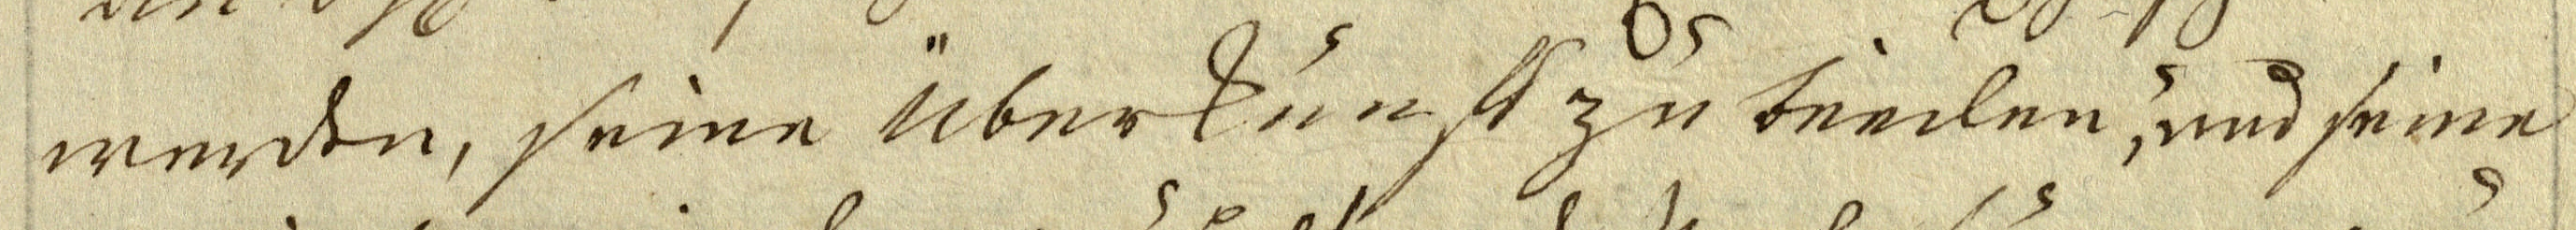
werden, seine Überkunft zu beeilen, und seine
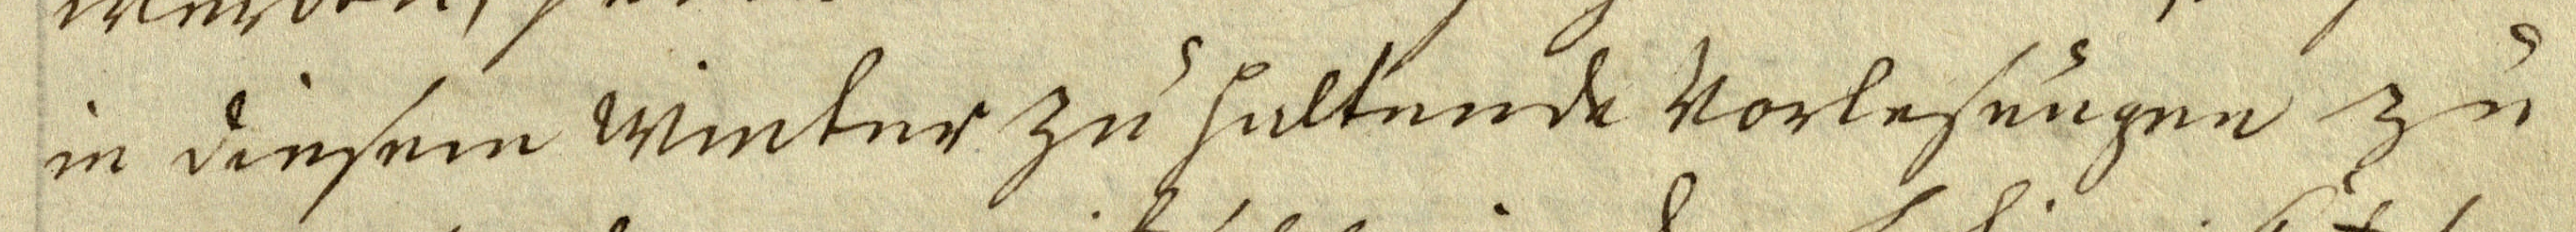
in diesem Winter zu haltende Vorlesungen zu
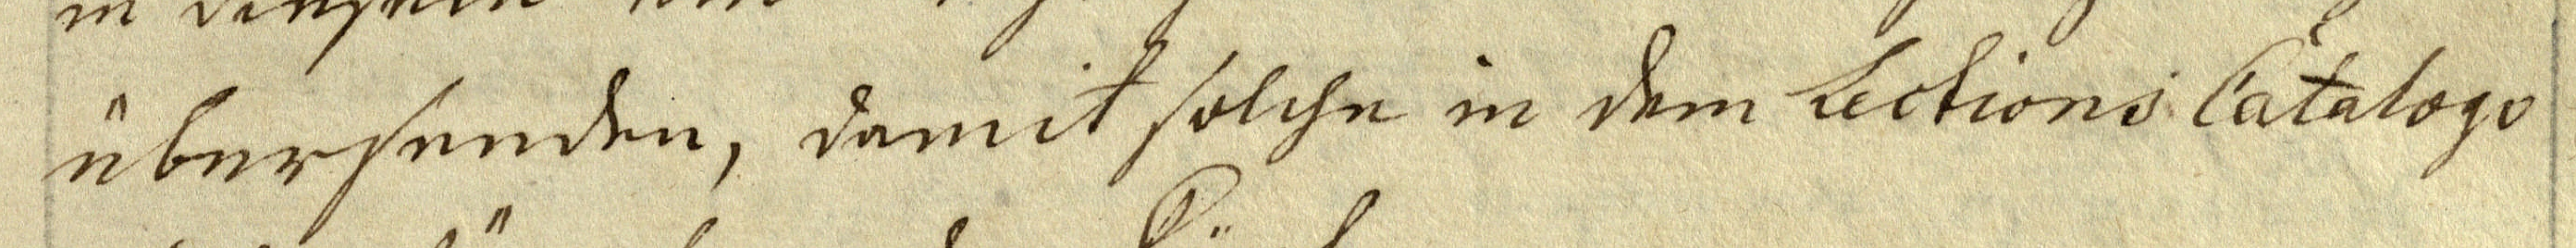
übersenden, damit solche in dem Lections Catalogo
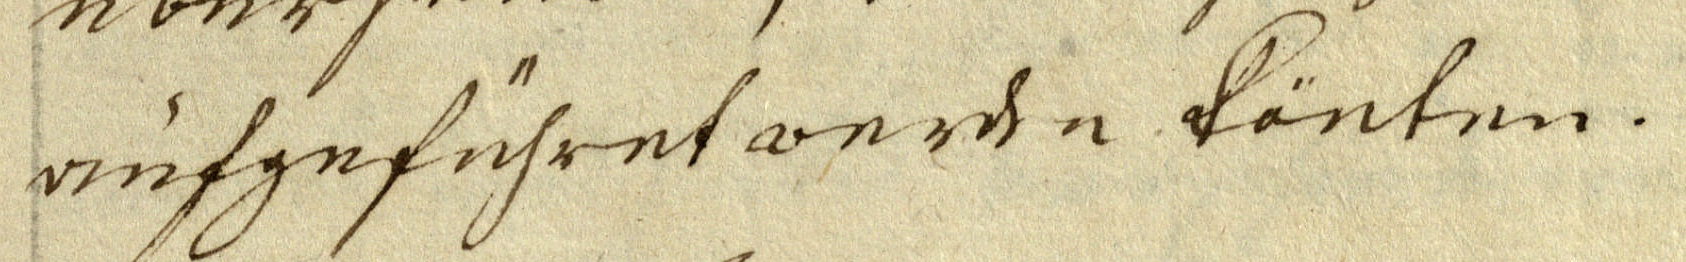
aufgeführet werden könten.
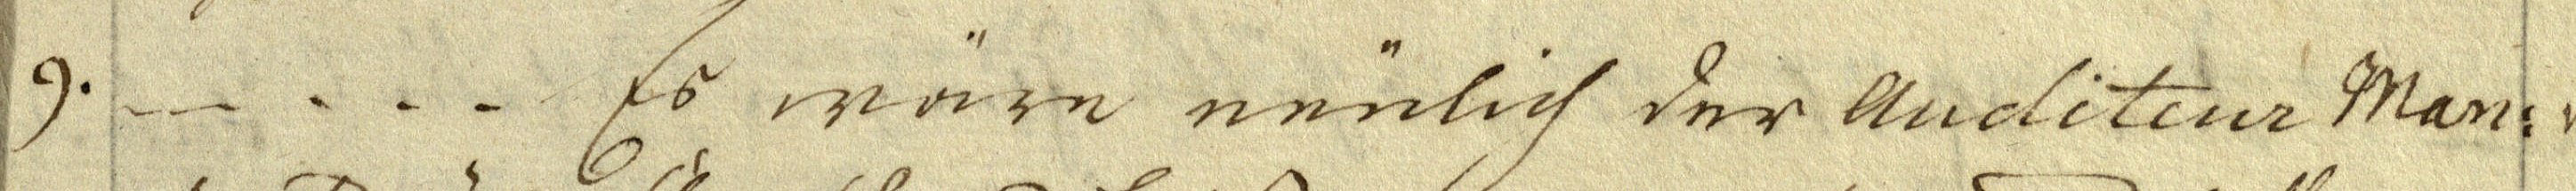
9, Es wäre neulich der Auditeur Man¬
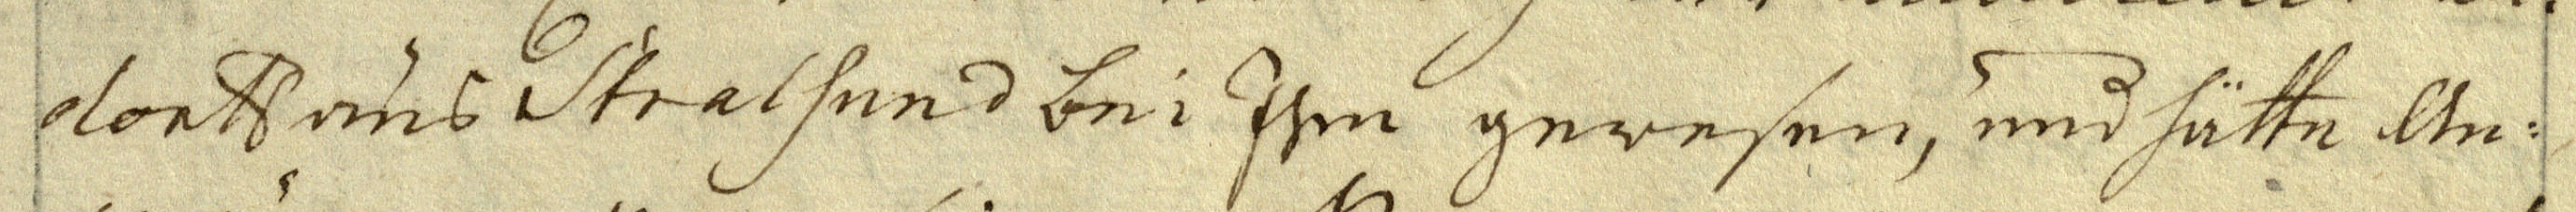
dorff aus Stralsund bei Ihm gewesen, und hätte An¬
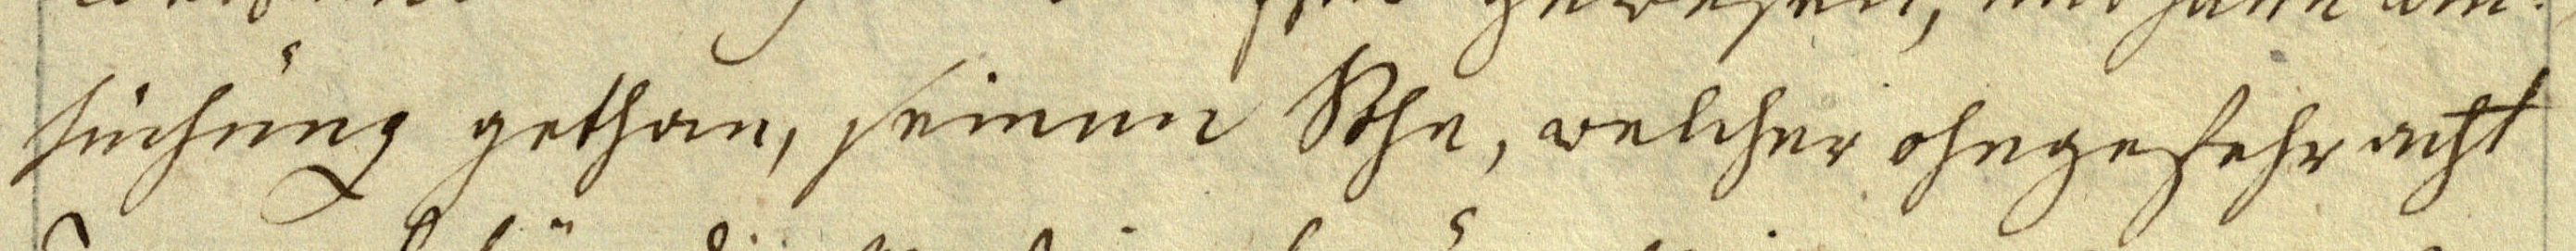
suchung gethan, seinen Sohn, welcher ohngefehr acht
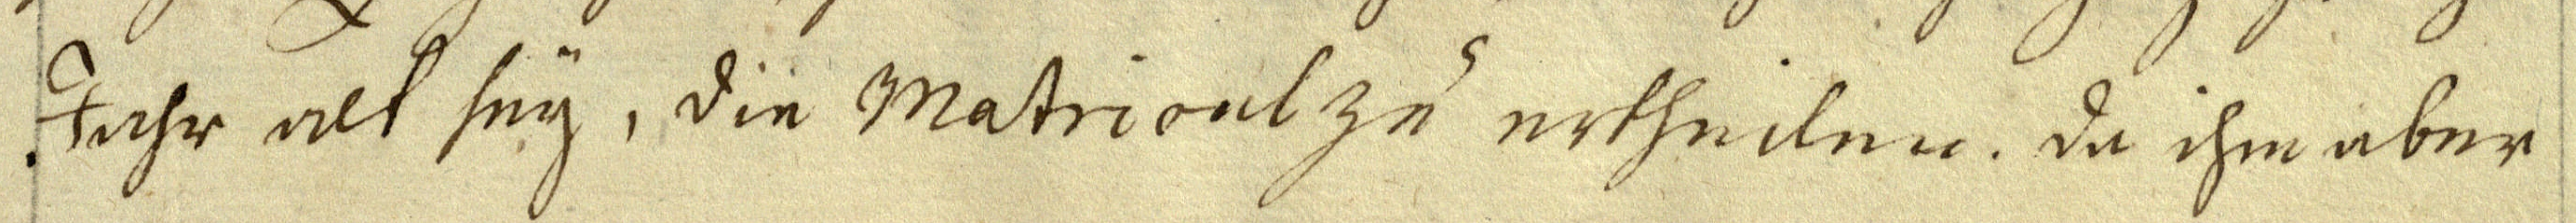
Jahr alt seÿ, die Matricul zu ertheilen. da ihm aber
